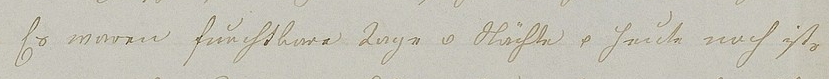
Es waren furchtbare Tage & Nächte & heute noch ists
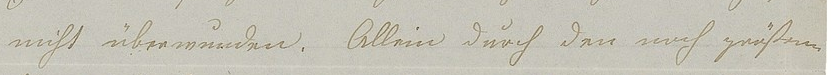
nicht überwunden. Allein durch den noch größeren
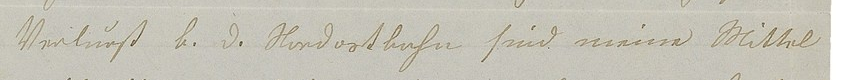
Verlust b. d. Nordostbahn sind meine Mittel
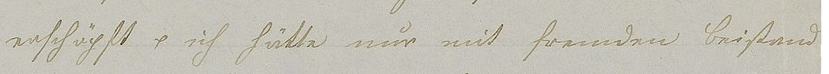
erschöpft & ich hätte nur mit fremden Beistand
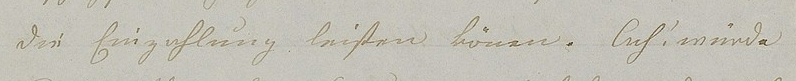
die Einzahlung leisten könen. Ach! würde
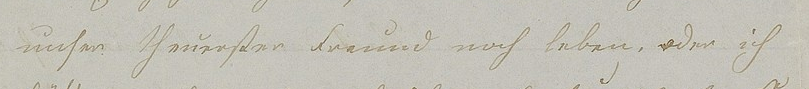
unser theuerster Freund noch leben, oder ich
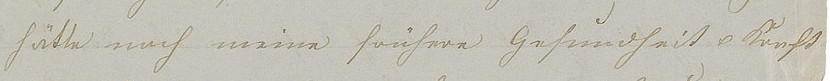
hätte noch meine frühere Gesundheit & Kraft
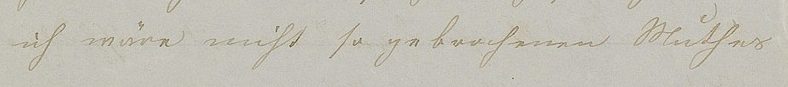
ich wäre nicht so gebrochenen Muthes.
